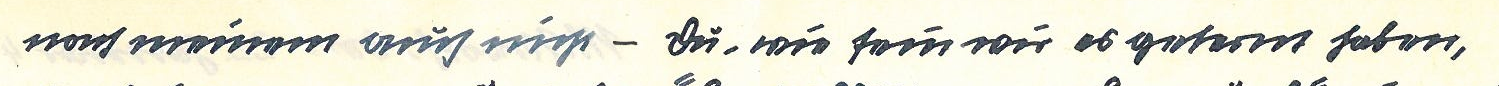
nach meinem auch nicht – Du, wie fein wir es gelernt haben,
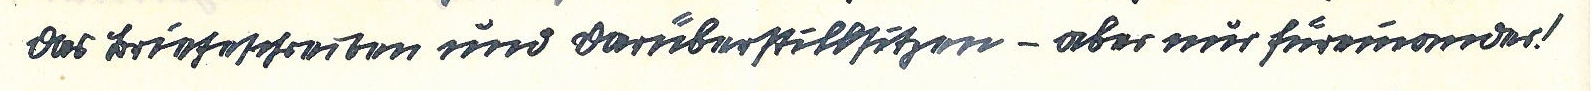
das Briefeschreiben und darüberstillsitzen – aber nur füreinander!
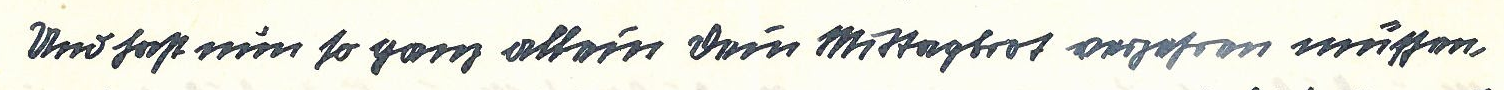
Und hast nun so ganz allein Dein Mittagbrot verzehren müssen,
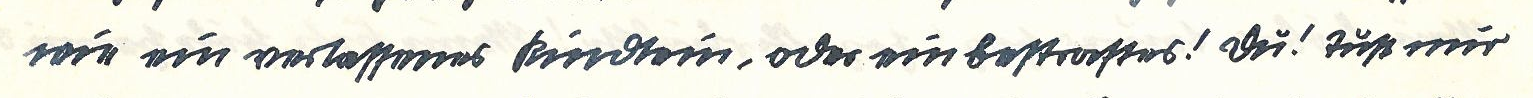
wie ein verlassenes Kindlein, oder ein bestraftes! Du! Tust mir
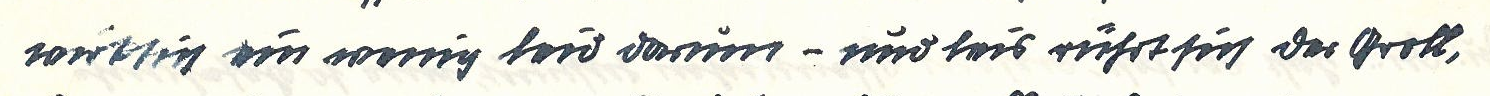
wirklich ein wenig leid darum – und leis rührt sich der Groll,
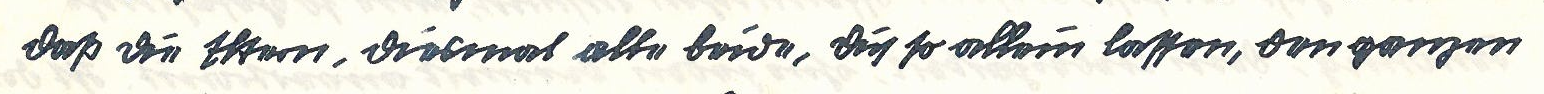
daß die Eltern, diesmal alle beide, Dich so allein lassen, den ganzen
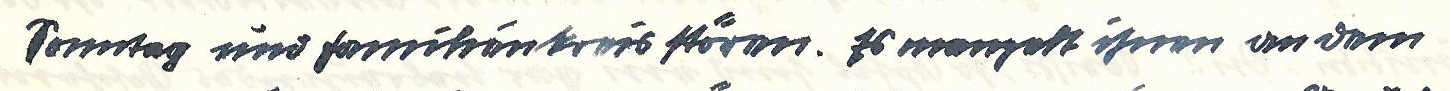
Sonntag und Familienkreis stören. Es mangelt ihnen an dem
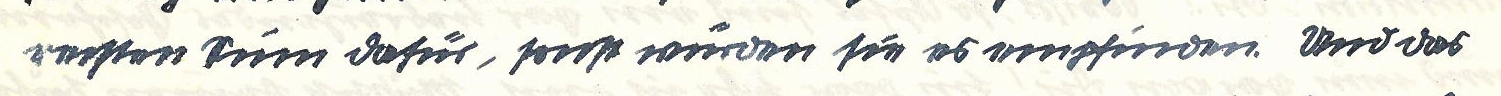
rechten Sinn dafür, sonst würden sie es empfinden. Und das
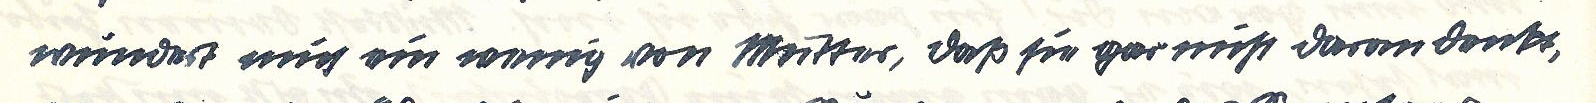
wundert mich ein wenig von Mutter, daß sie gar nicht daran denkt,
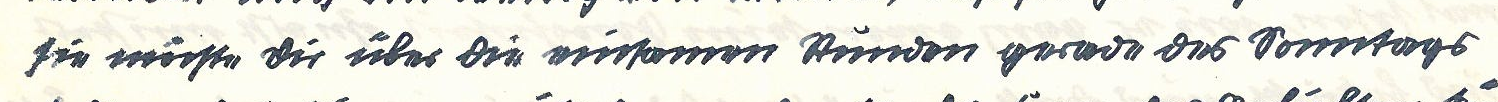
sie möchte Dir über die einsamen Stunden gerade des Sonntags
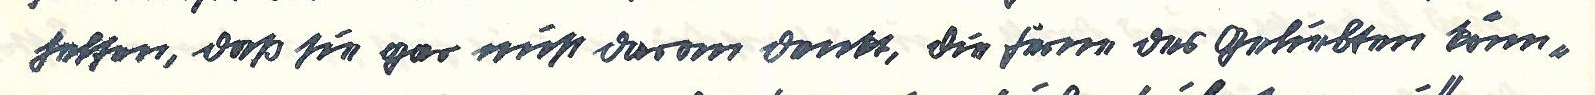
helfen, daß sie gar nicht daran denkt, die Ferne des Geliebten könn
